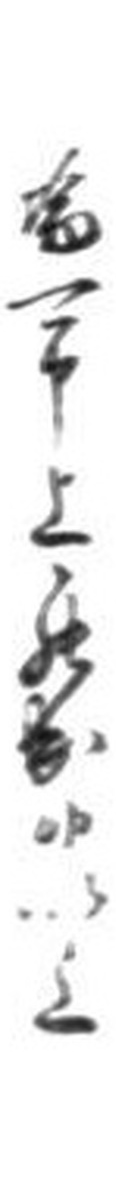為可申上罷出候以上
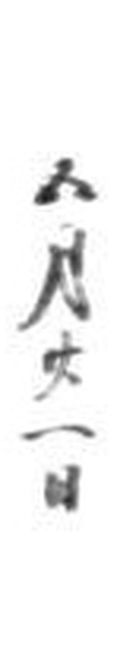五月廿一日
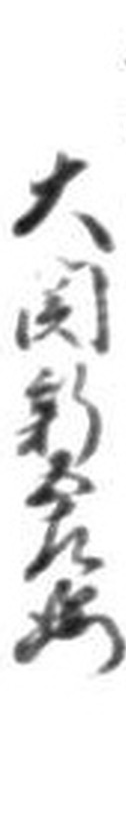大関新五左衛門
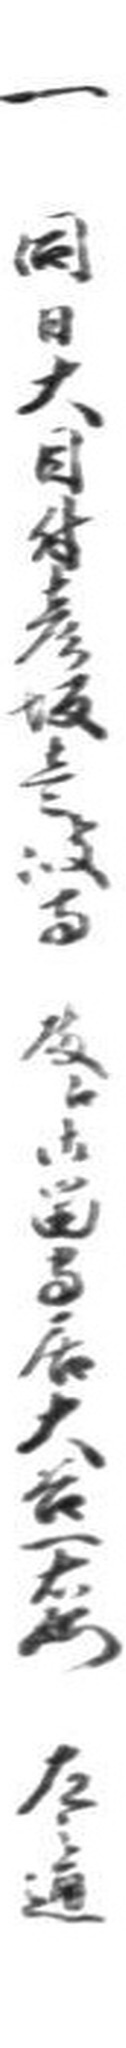一同日大目付彦坂壱岐守殿江御留守居大谷一右衛門左之通
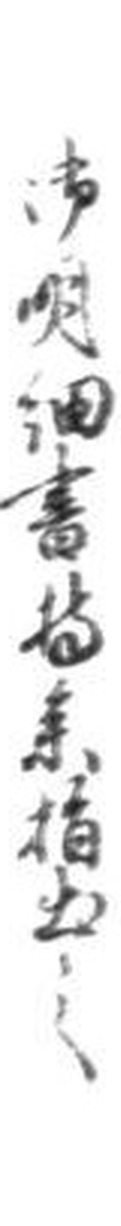御明細書持参指出之
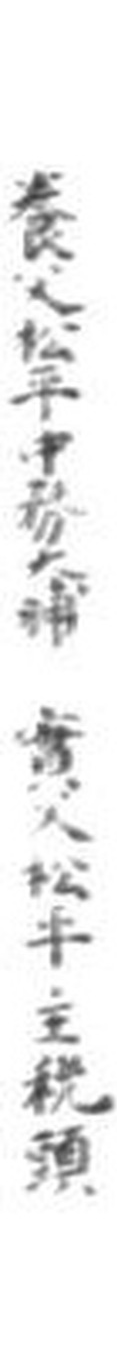養父松平中務大輔実父松平主税頭
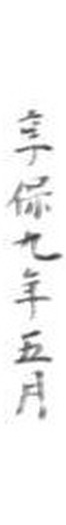享保九年五月
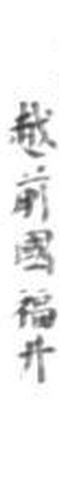居城越前国福井

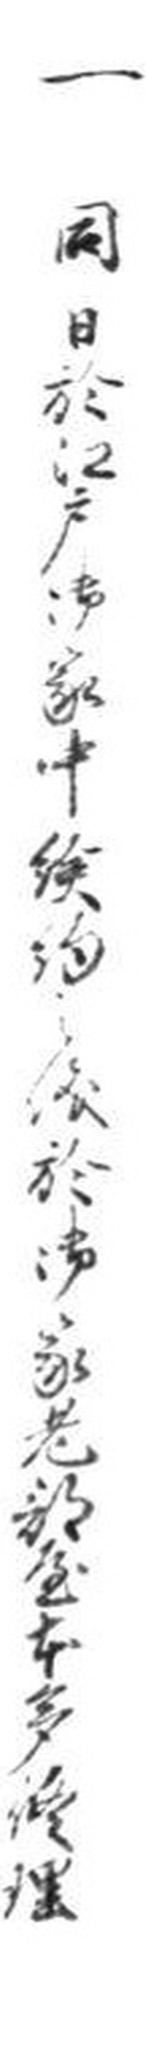一同日於江戸御家中倹約之儀於御家老部屋本多修理
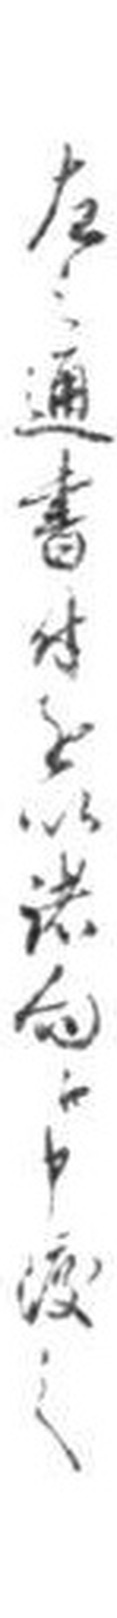左之通御書付を以諸向江申渡之
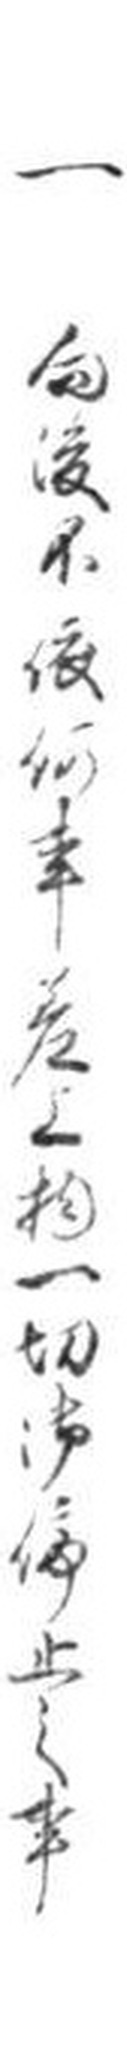一向後不依何事差上物一切御停止之事
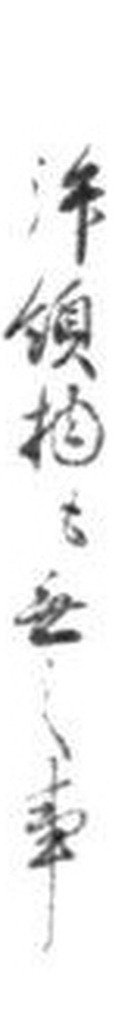拝領物も無之事
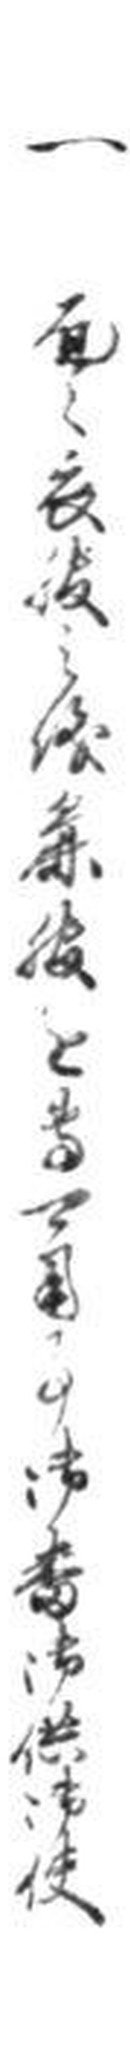一面々衣服之儀麁服を専可用事御番御供御使
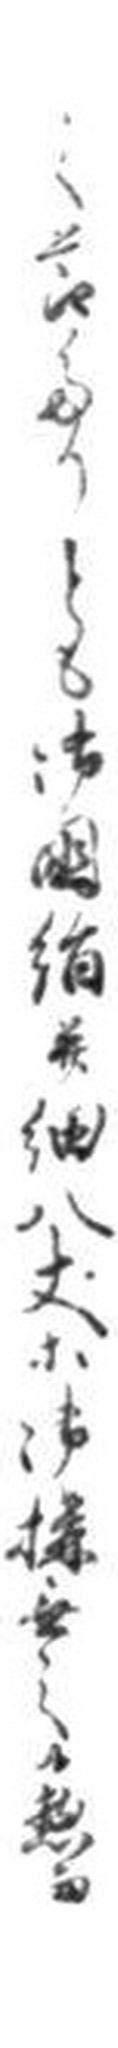之節たりとも御国絹并細八丈等御構無之候惣而
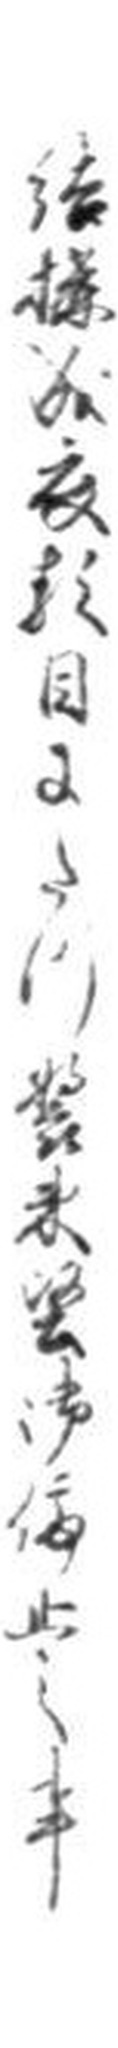結構成衣類目にたつ装束堅御停止之事
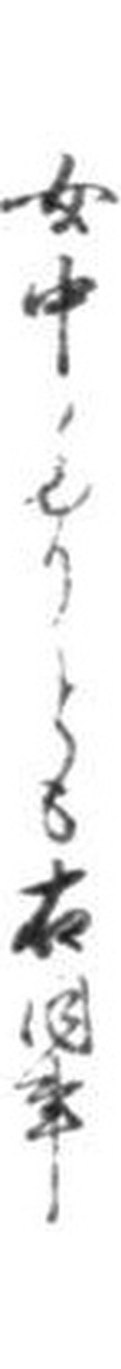女中たりとも右同事
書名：家譜 三十八 宗矩公 従享保九年五月到享保九年十二月
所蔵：福井県文書館 Fukui Prefectural Archives
